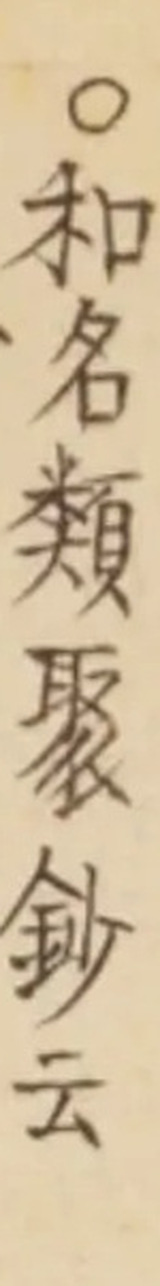〇倭名類聚草鈔云
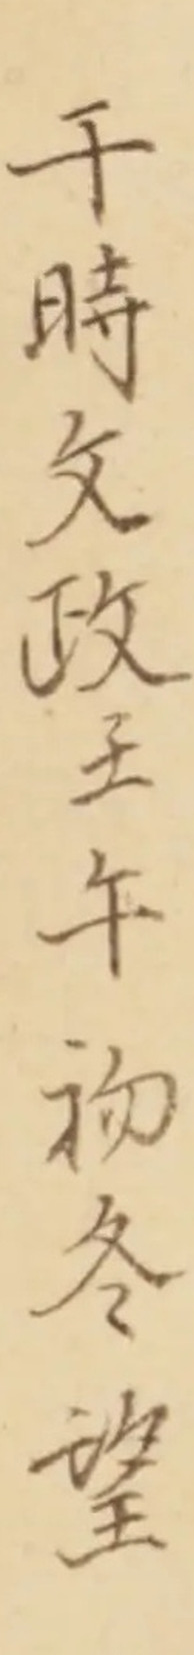于時文政壬午初冬望
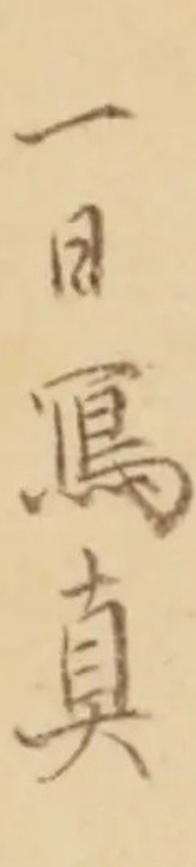一日写真
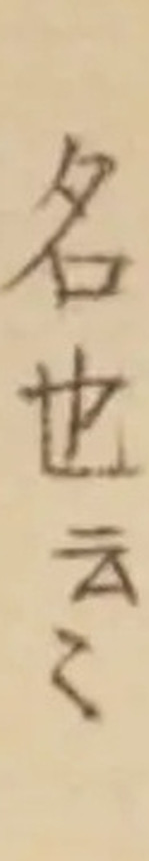名也云々

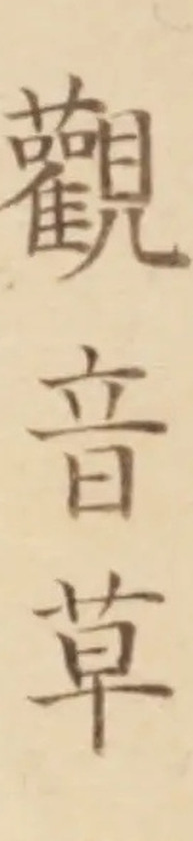観音草
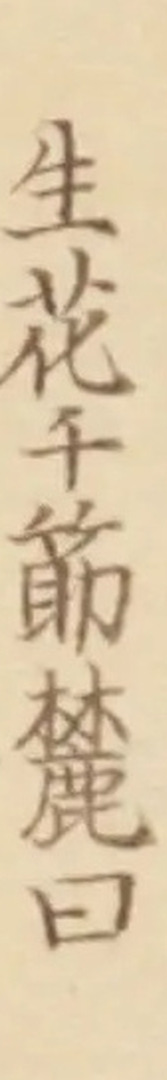生花千節麓曰
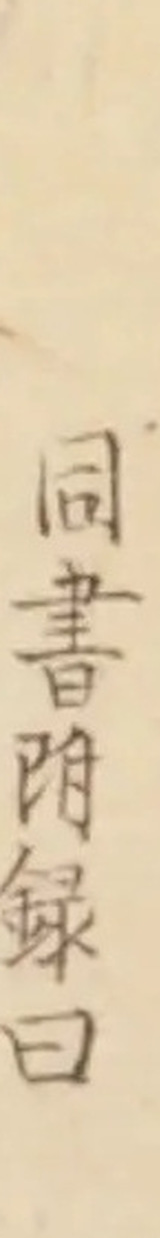同書附録曰
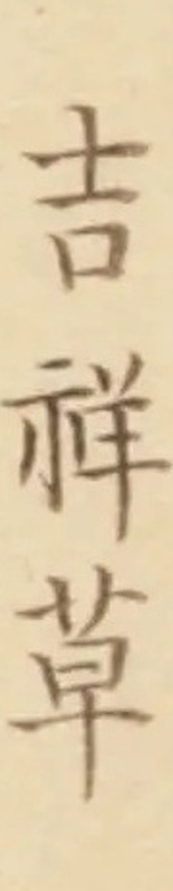吉祥草
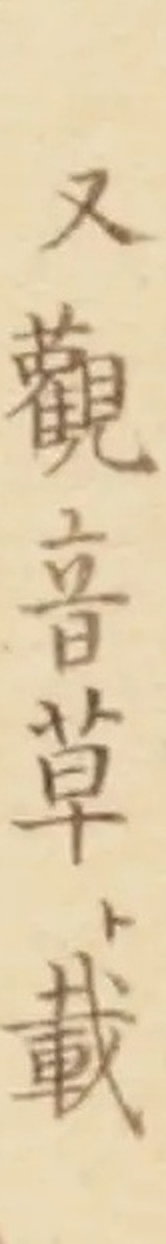又観音草載
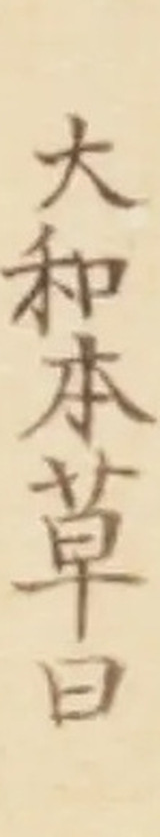大和本草曰
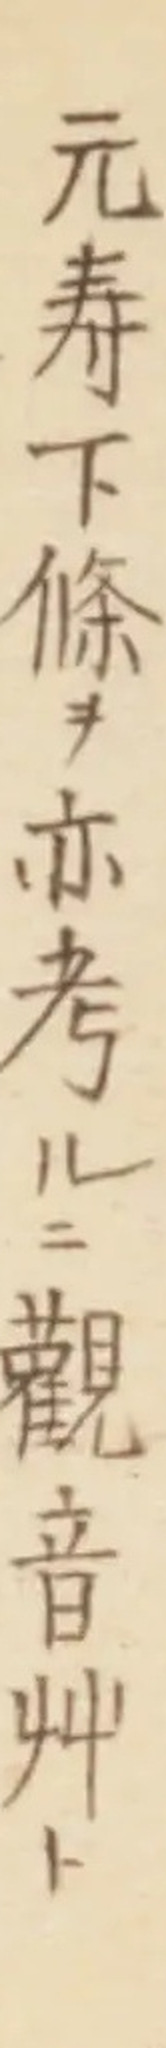元寿下條亦考ル観音草ト
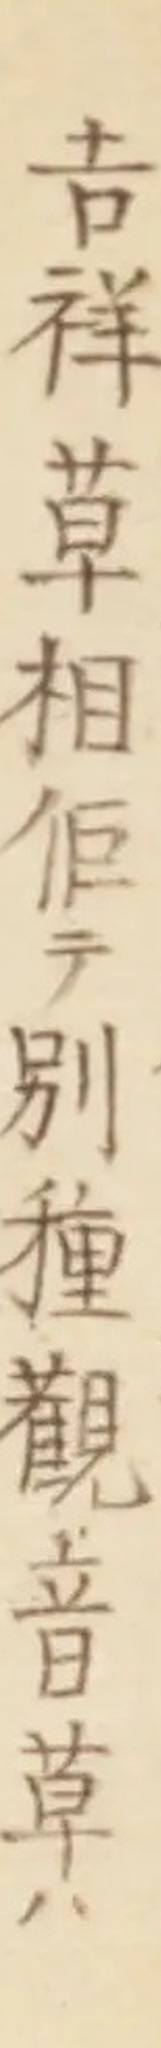吉祥草相似テ別種観音草ハ
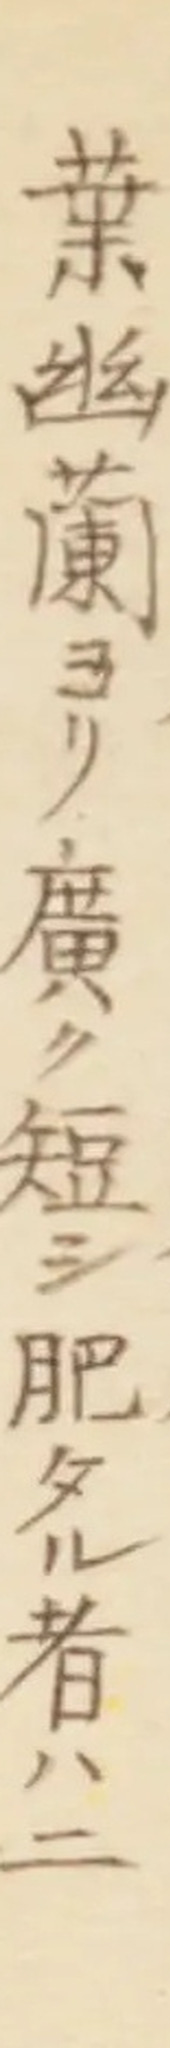葉幽蘭ヨリ広ク短シ肥タル者ハ二
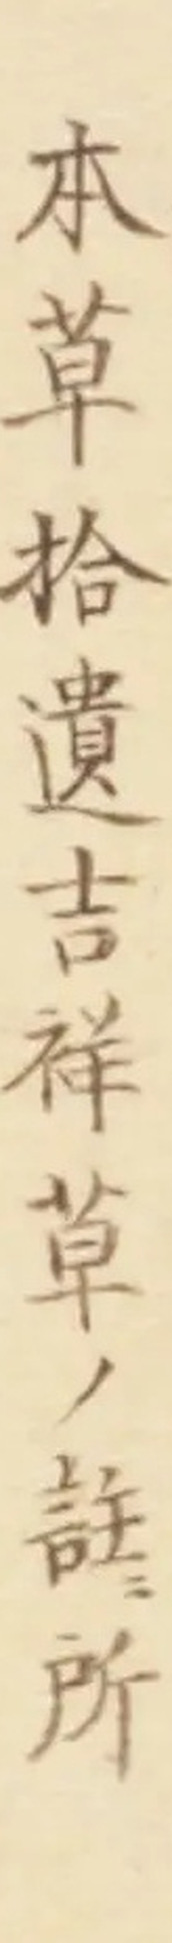本草拾遣吉祥草ノ註所
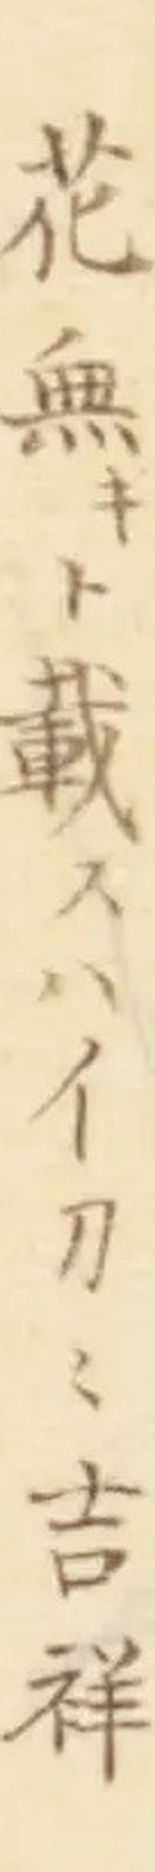花無ト載ハイカヾ吉祥
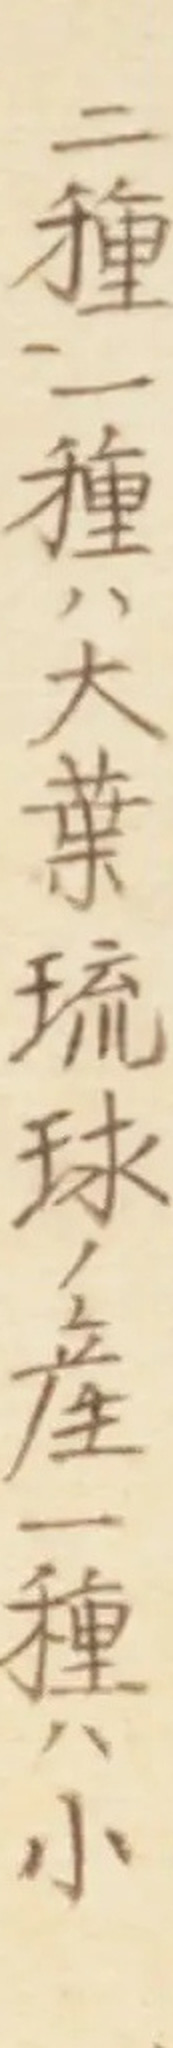二種一種ハ大葉琉球ノ産一種ハ小
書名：梅園草木花譜冬之部
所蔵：国立国会図書館 National Diet Library, JAPAN
